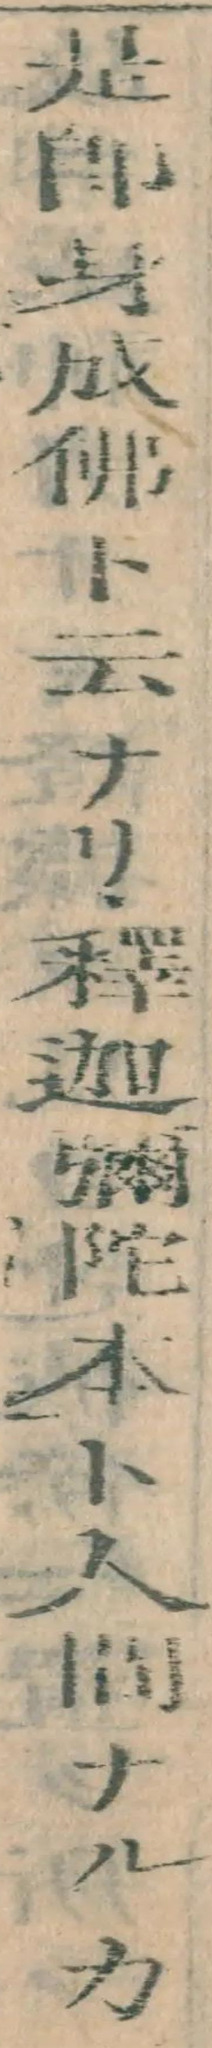是即身成仏ト云ナリ釈迦弥陀本ト人間ナルカ

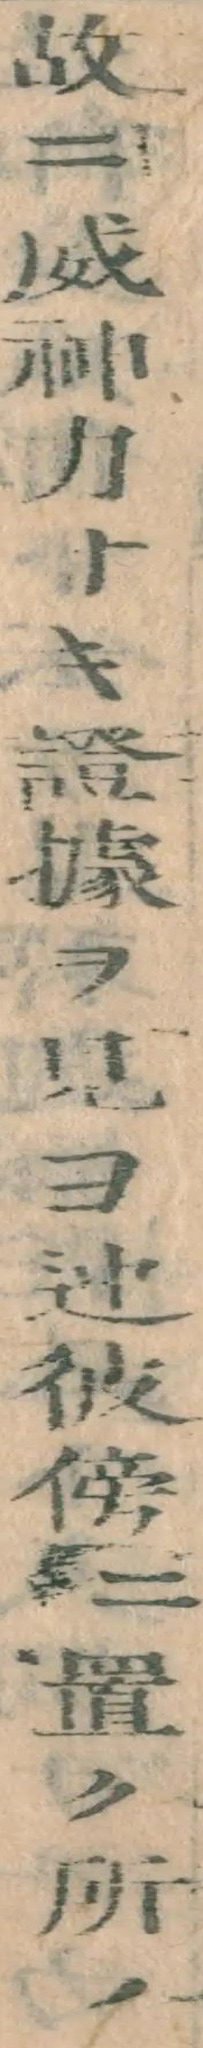故ニ威神力ナキ証拠ヲ見ヨ迚彼傍ニ置ク所ノ
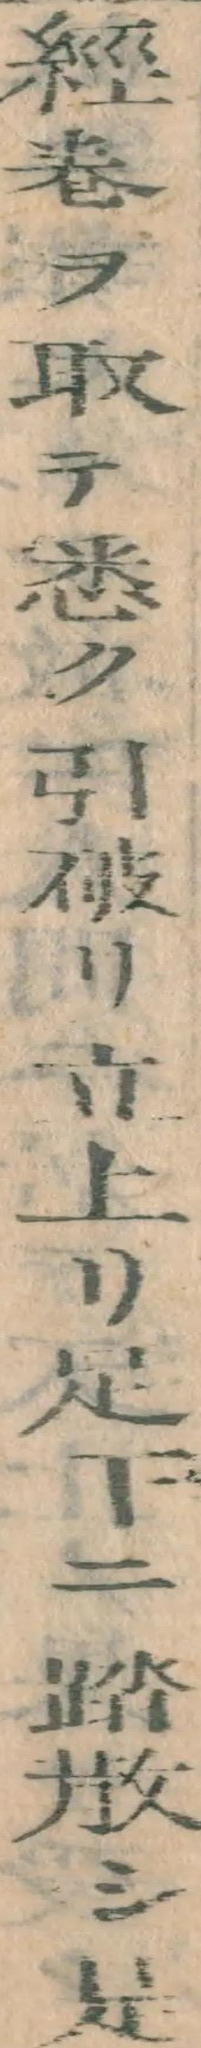経巻ヲ取テ悉ク引破リ立上リ足下ニ踏散シ是
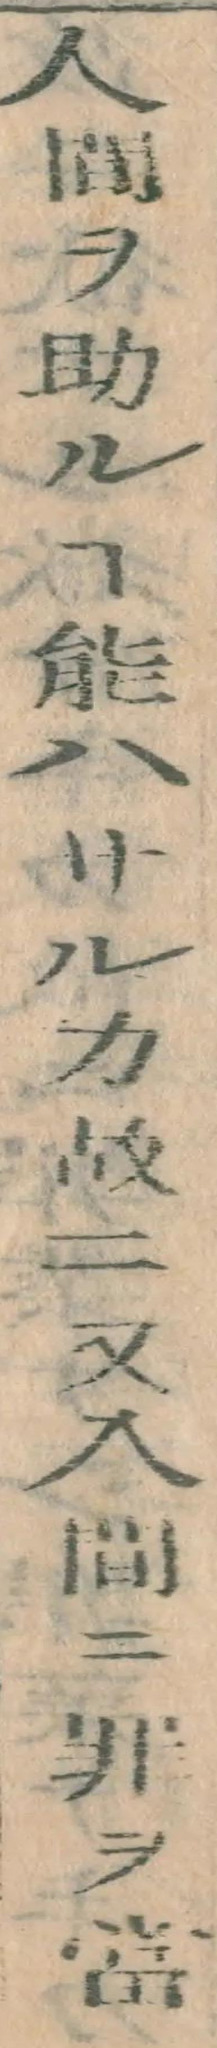人間ヲ助ルヿ能ハサルカ故ニ又人間ニ罪ヲ当
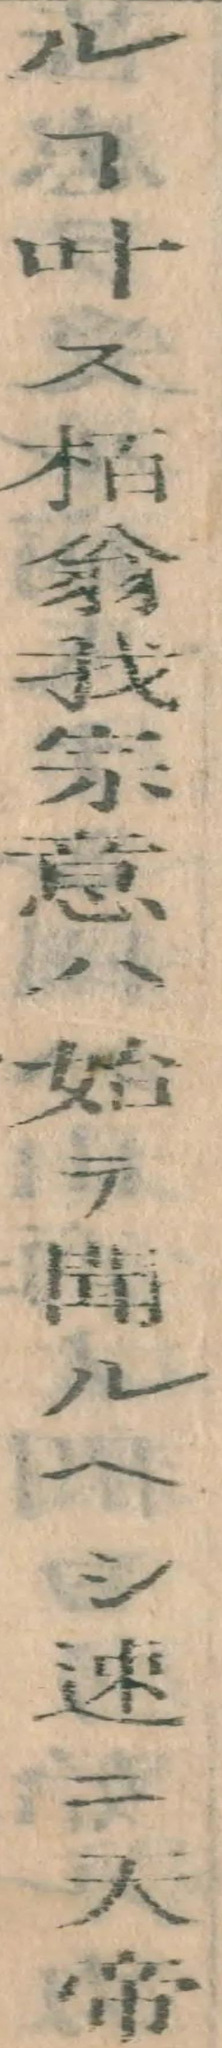ルヿ叶ス栢翁我宗意ハ始テ聞ルヘシ速ニ天帝
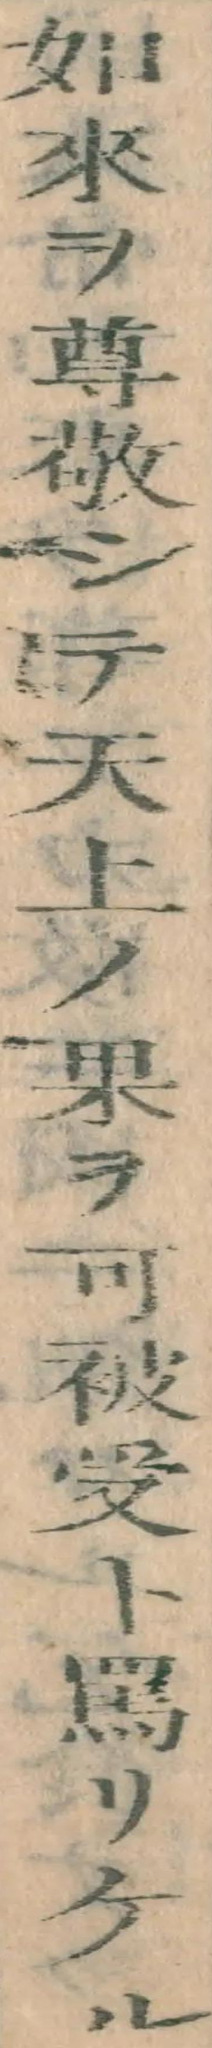如来ヲ尊敬シテ天上ノ果ヲ可被受ト罵リケル
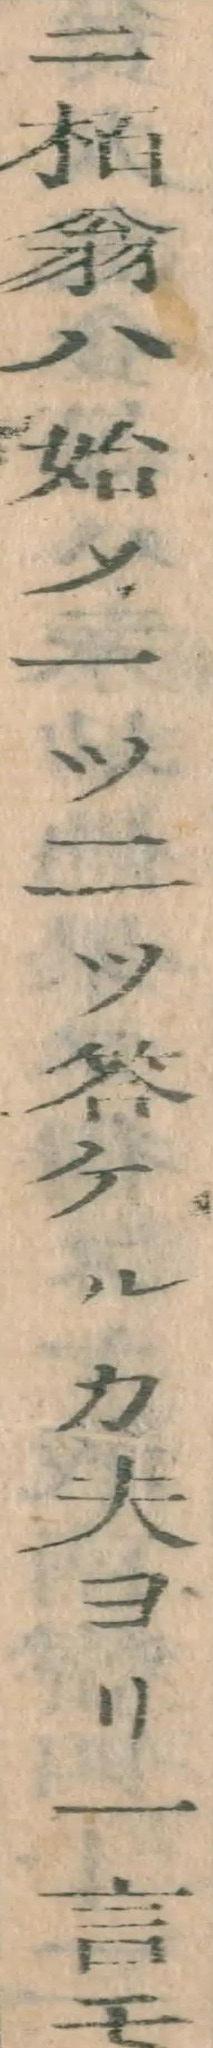ニ栢翁ハ始メ一ツ二ツ答ケルカ夫ヨリ一言モ
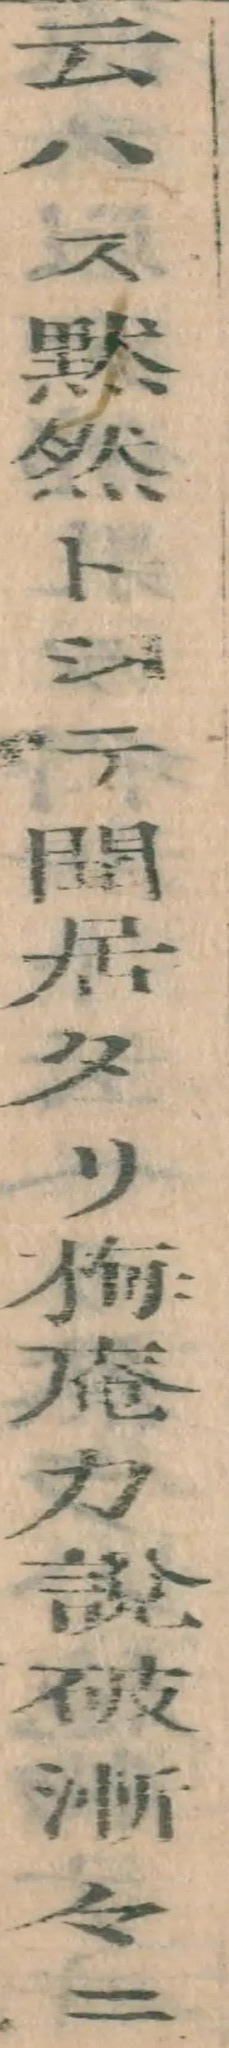云ハス黙然トシテ聞居タリ梅庵力説破漸々ニ
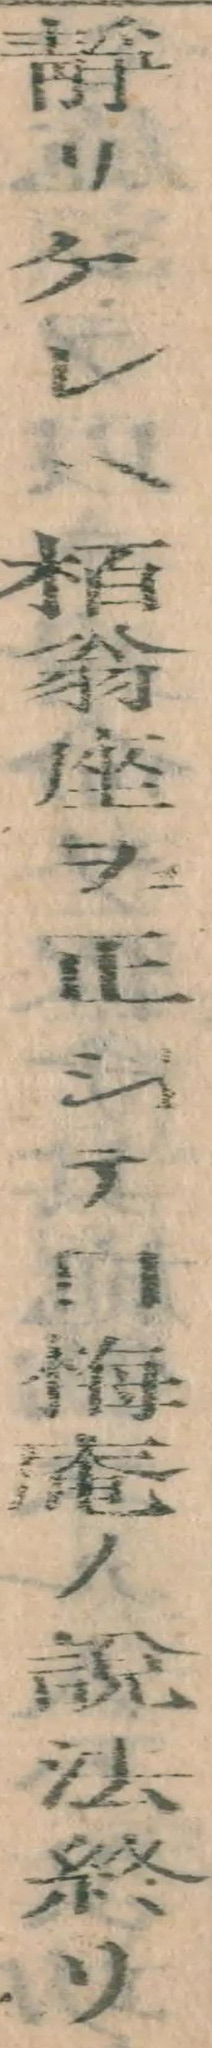静リケレハ栢翁座ヲ正シテ曰梅庵ノ説法終リ
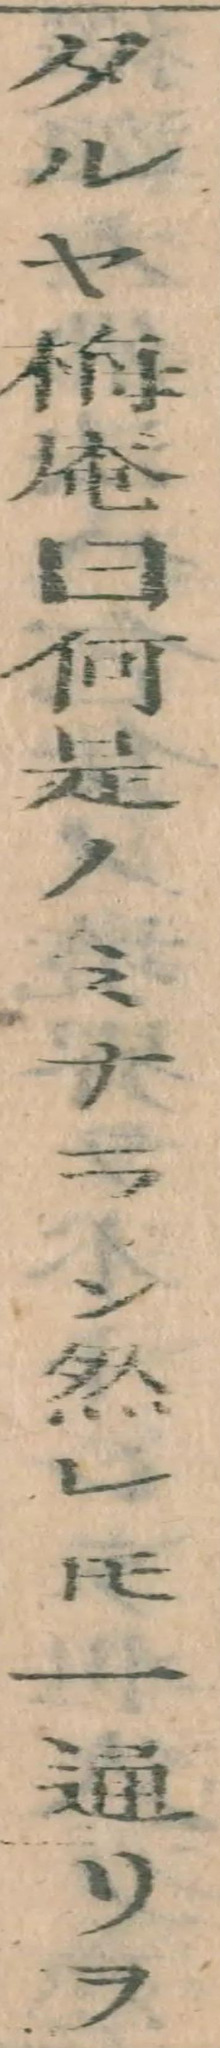タルヤ梅庵曰何是ノミナラン然レトモ一通リヲ
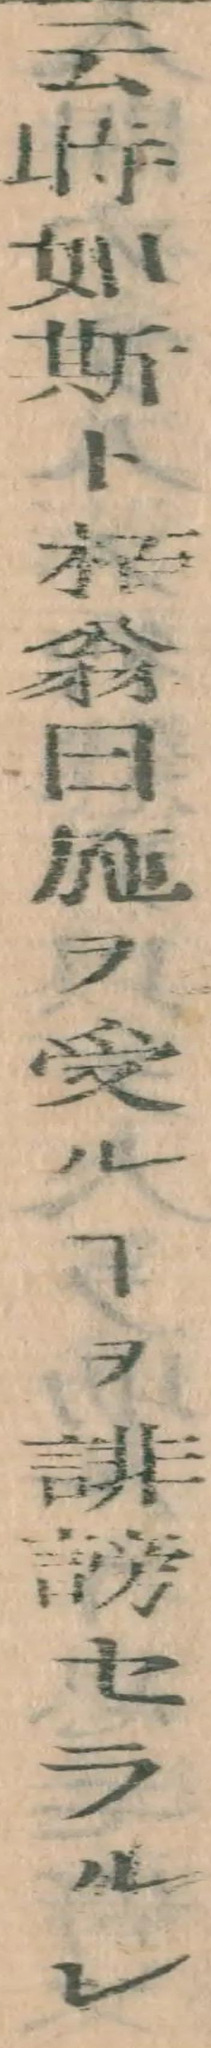云時如斯ト栢翁曰施ヲ受ルヿヲ誹謗セラルレ
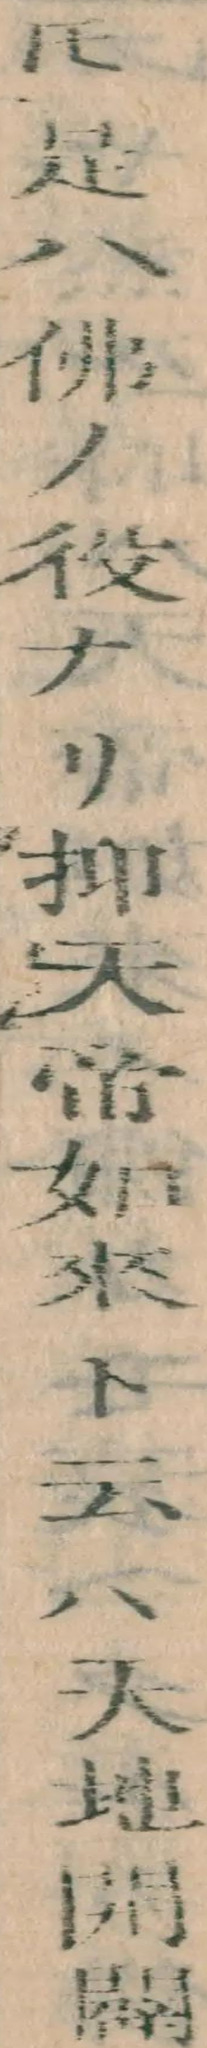トモ是ハ仏ノ役ナリ抑天帝如来ト云ハ天地開闢
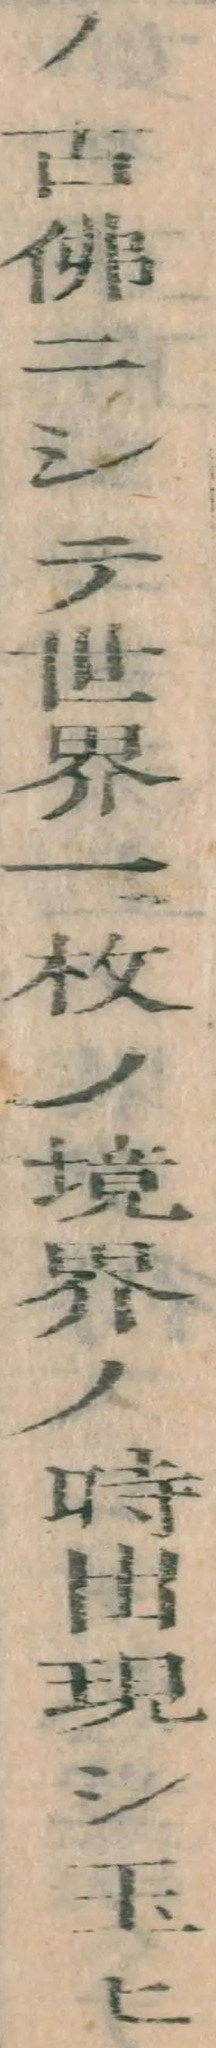ノ古仏ニシテ世界一枚ノ境界ノ時出現シ玉ヒ
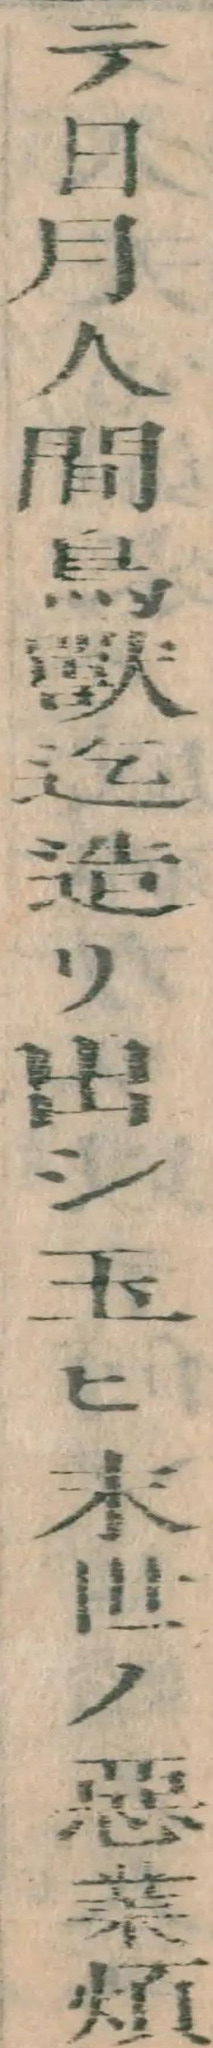テ日月人間鳥獣迄造リ出シ玉ヒ末世ノ悪業煩
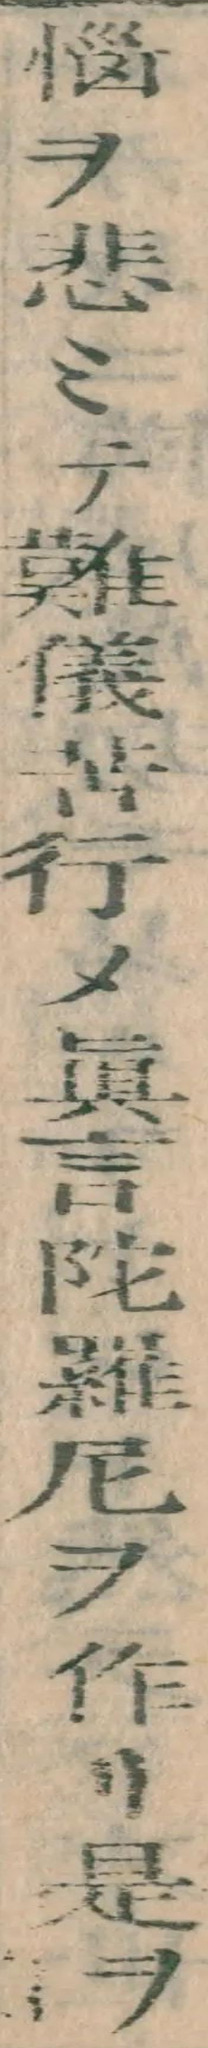悩ヲ悲ミテ難儀苦行シテ真言陀羅尼ヲ作リ是ヲ
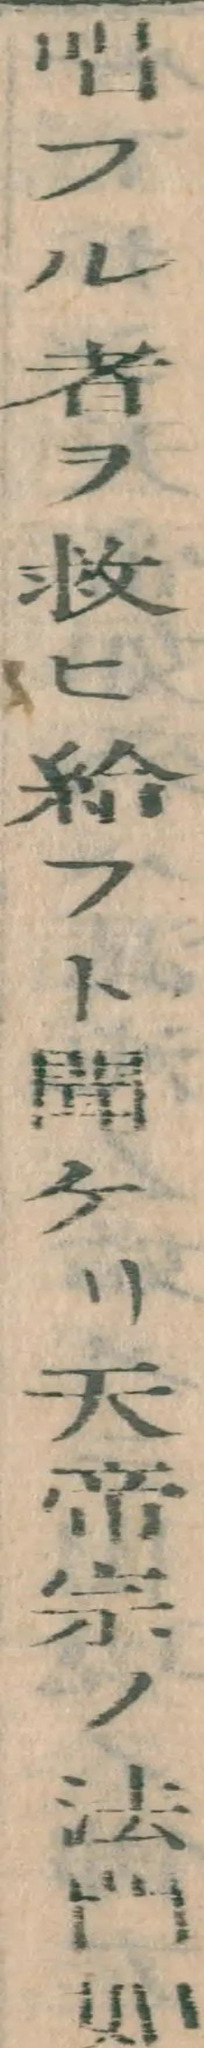唱フル者ヲ救ヒ給フト聞ケリ天帝宗ノ法門如
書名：南蛮寺興廃記
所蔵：国立国会図書館 National Diet Library, JAPAN
